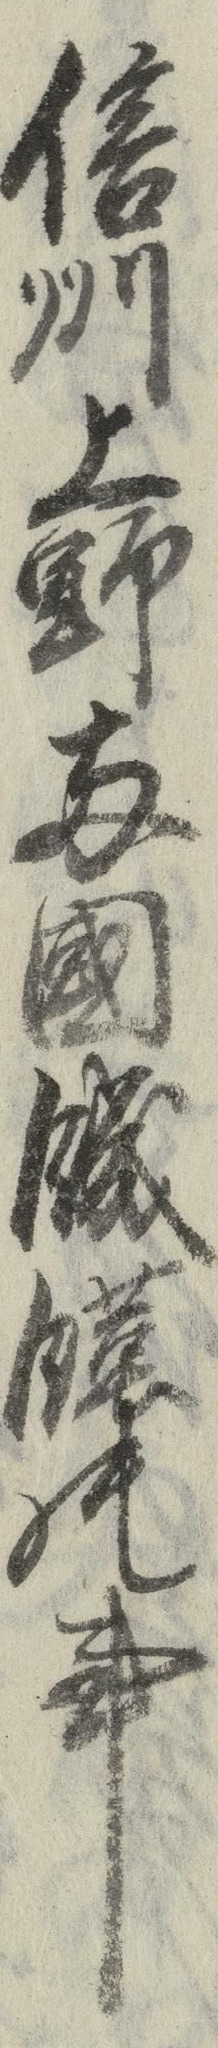信州上野両国饑饉の事
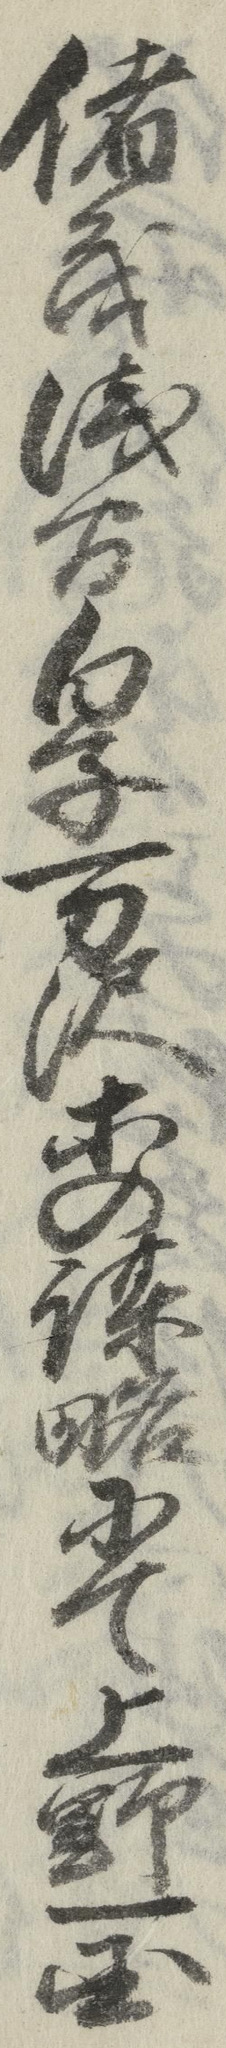偖も浅間白子万沢等の謀略にて上野一国
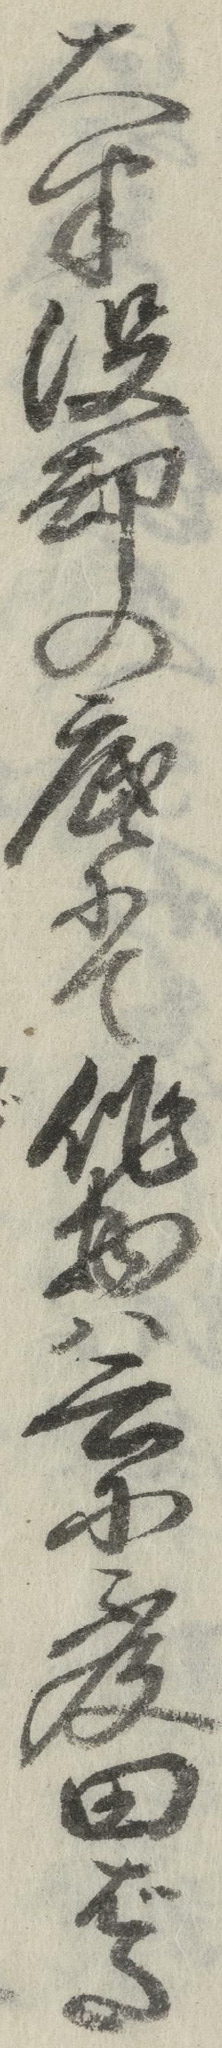大半没却の底にて作物は云に不及田ばた
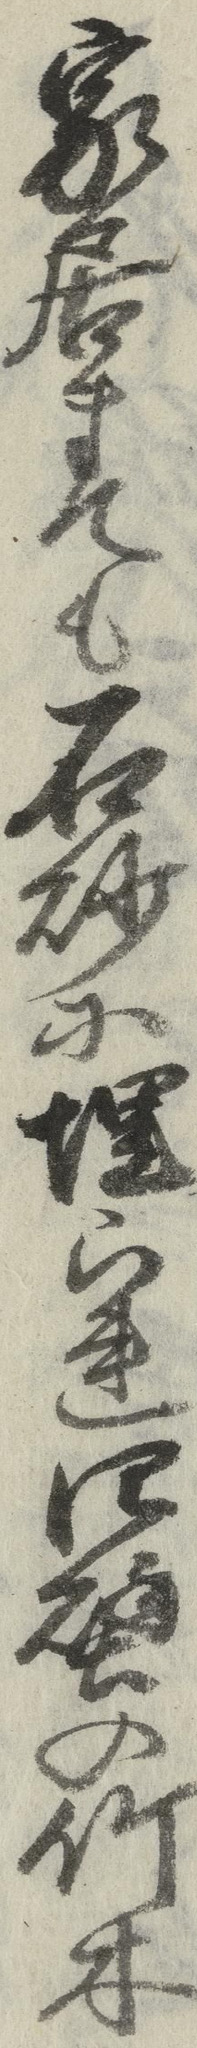家居まても石砂に埋られ四壁の竹木
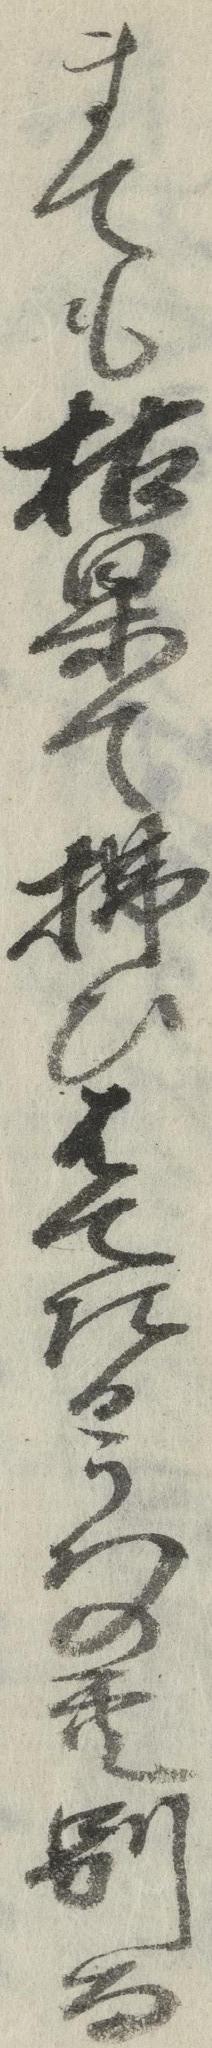まても枯果て払ひはてたるうわの空別而
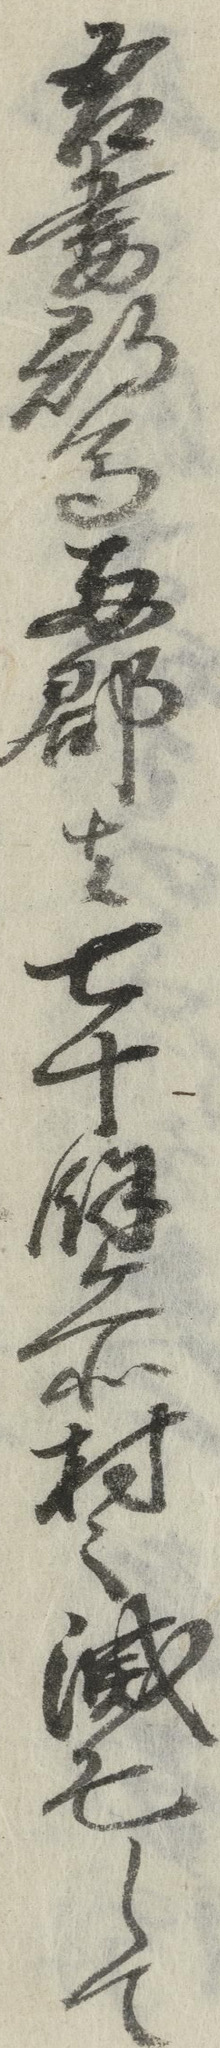吾妻郡馬両郡は七十餘ケ所村々滅亡して
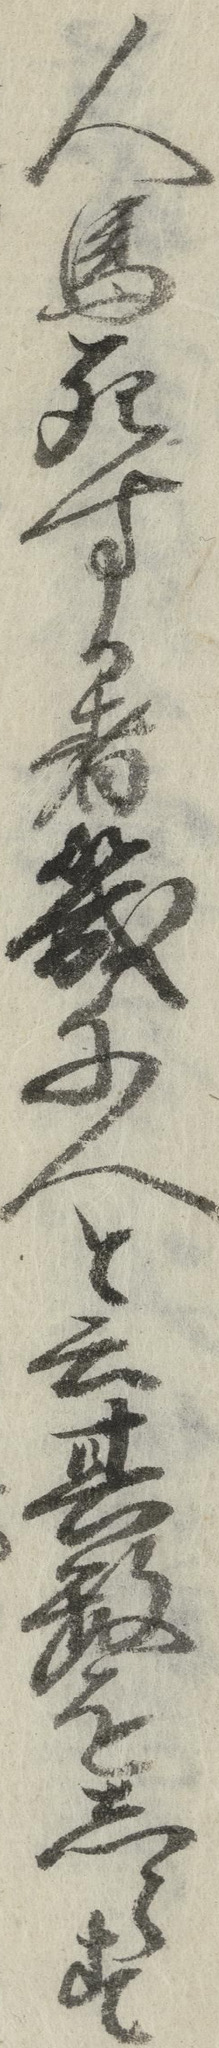人馬死する者幾千人と云其数をしらす

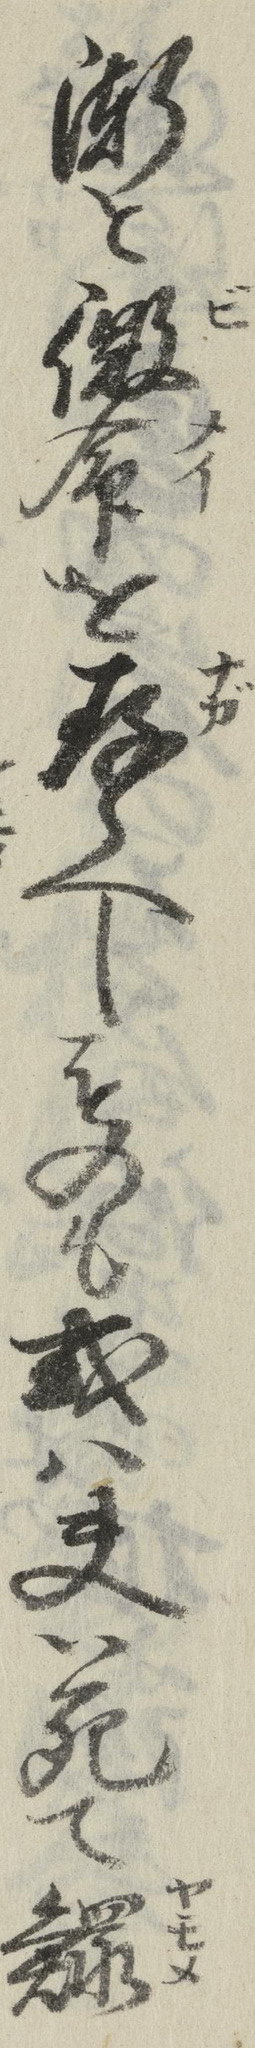漸と微命を存らへしものも或は夫は死て鰥
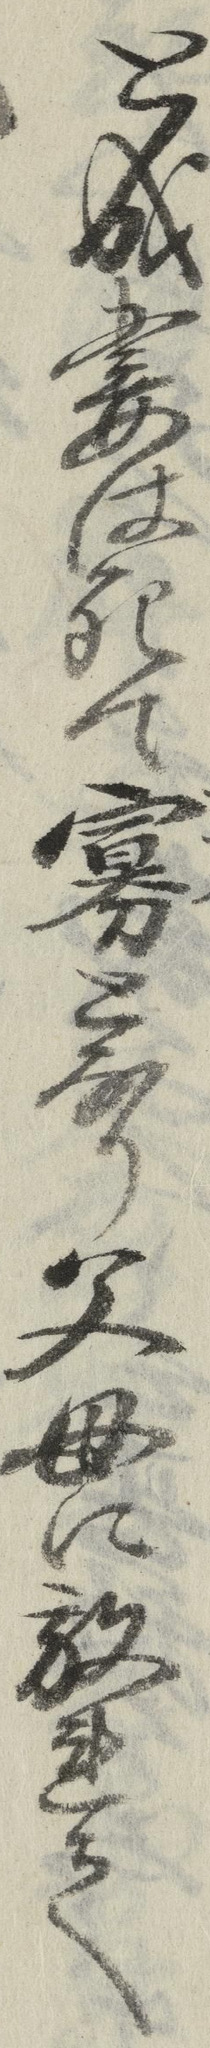と成妻は死て寡となり父母に放れて
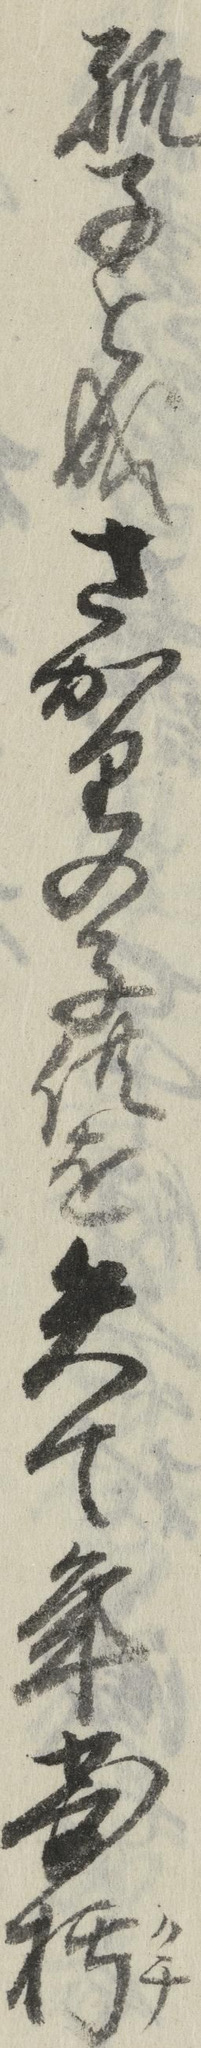孤子と成さかりの子供を失て年寄朽
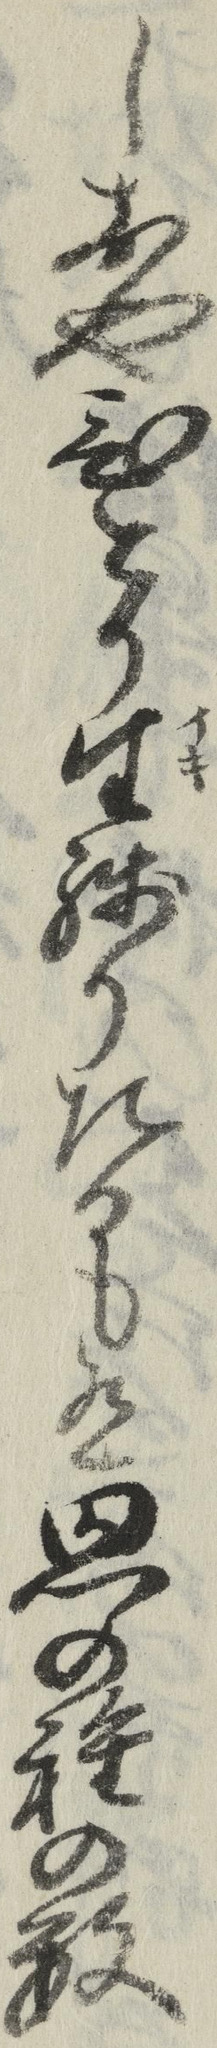しおやひとり生残りたるも有思の種の数
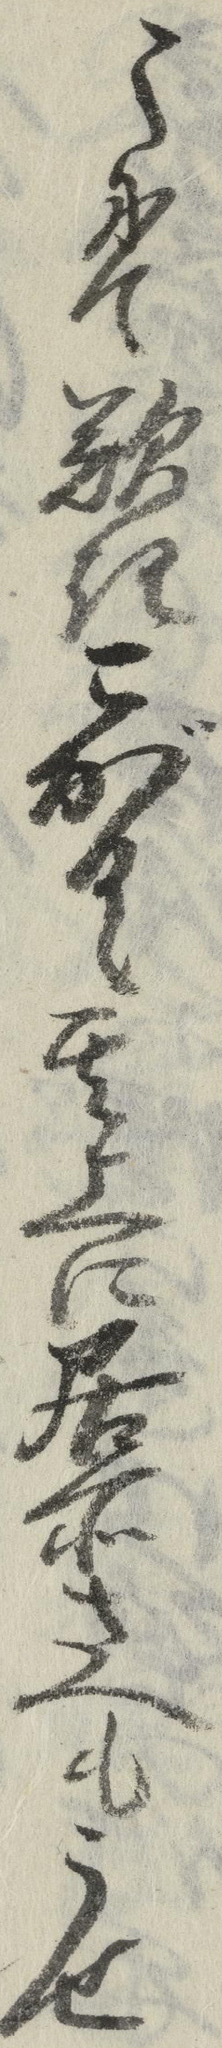々にて歎きこがるゝ其上に居所さへもうせ
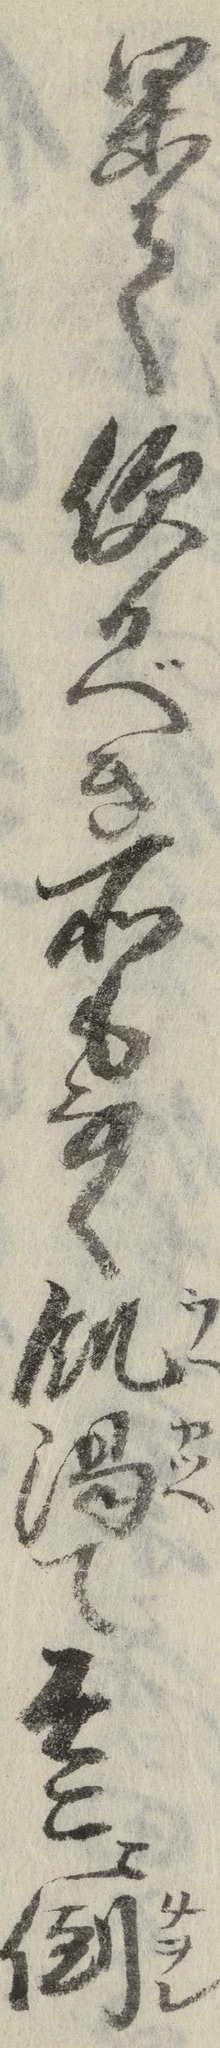果て便るべき所もなく飢渇てそこに倒
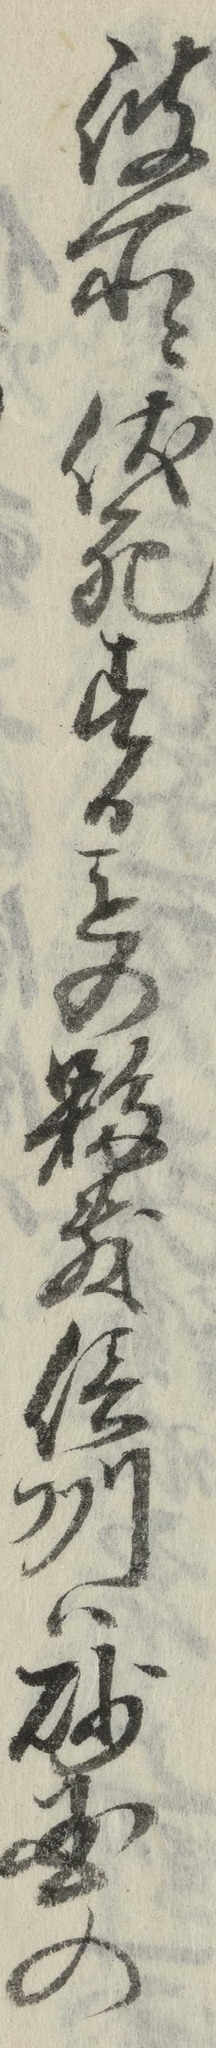彼所に伏死するもの夥敷信州は砂国の
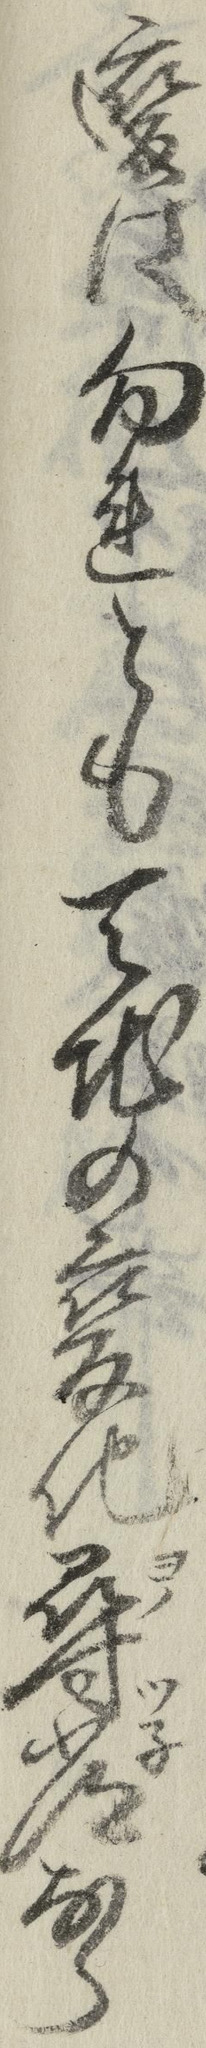変は勿れとも天地の変化尋常なら
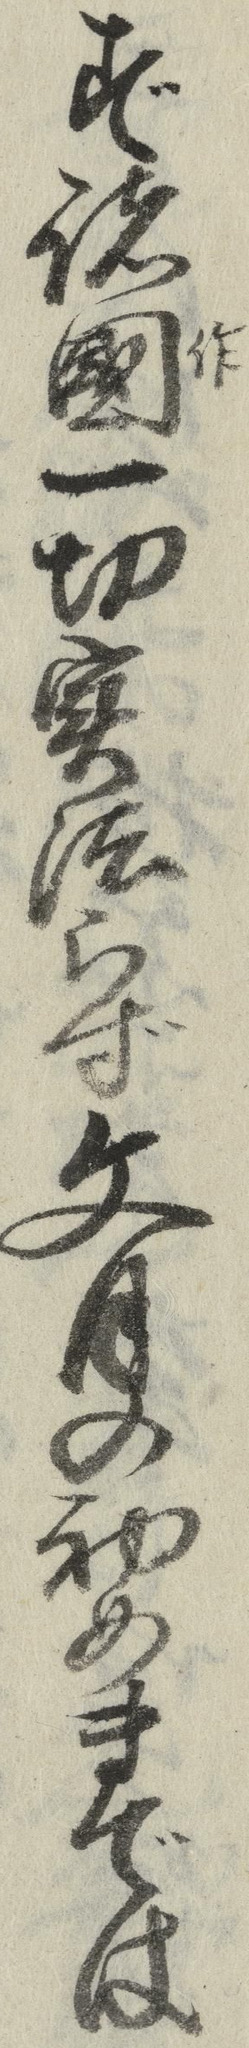ず諸国一切実法らず文月の初めまでは
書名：浅間大焼騒動記　上
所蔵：東京大学地震研究所図書室 Earthquake Research Institute Library, The University of Tokyo, JAPAN
